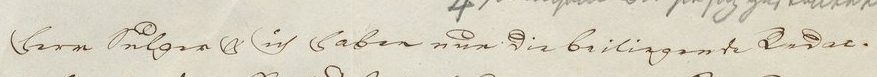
Herr Sulzer & ich haben nun die beiliegende Redac-
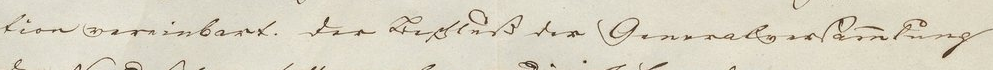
tion vereinbart. Der Beschluß der Generalversammlung
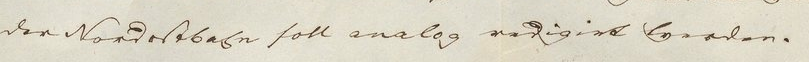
der Nordostbahn soll analog redigirt werden.
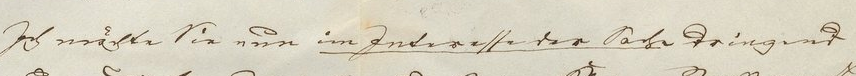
Ich möchte Sie nur im Interesse der Sache dringend
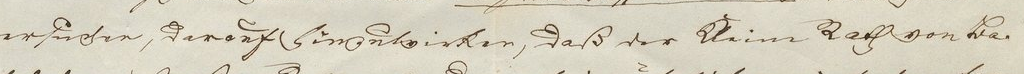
ersuchen, darauf hinzuwirken, daß der Kleine Rath von Ba-
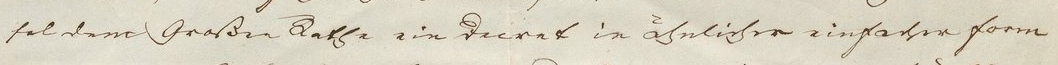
sel dem Großen Rathe ein Decret in ähnlicher einfacher Form
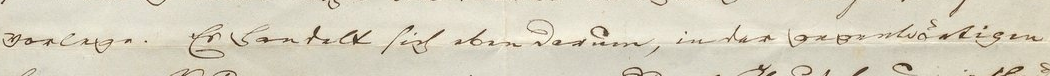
vorlege. Es handelt sich eben darum, in der gegenwärtigen
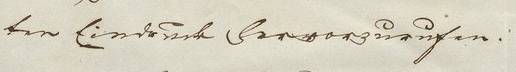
ten Eindruck hervorzurufen.
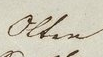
Olten
